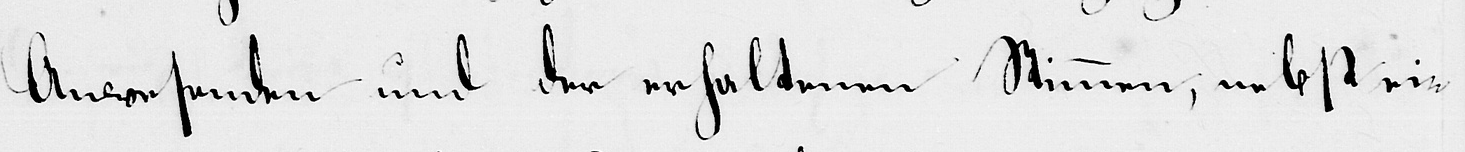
Anwesenden und der erhaltenen Stimmen, nebst ei¬
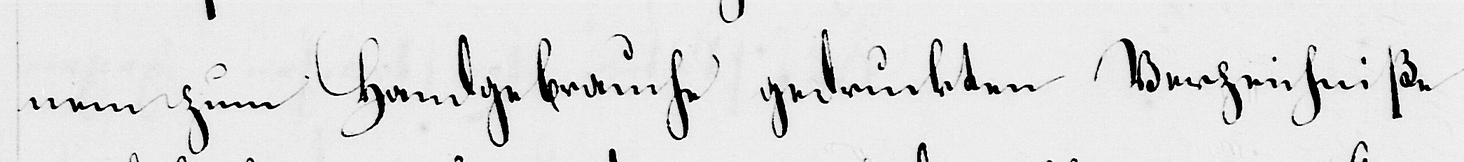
nem zum Handgebrauche gedruckten Verzeichniße
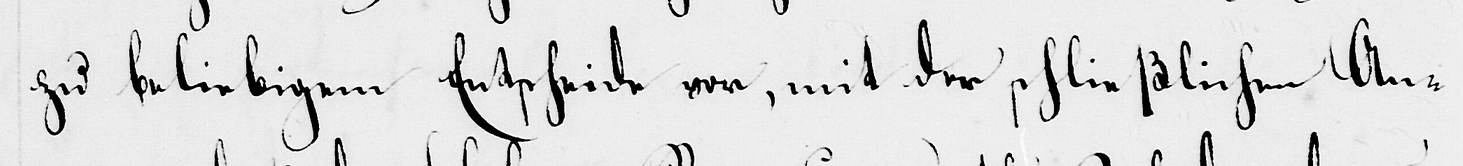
zu beliebigem Entscheide vor, mit der schließlichen An¬
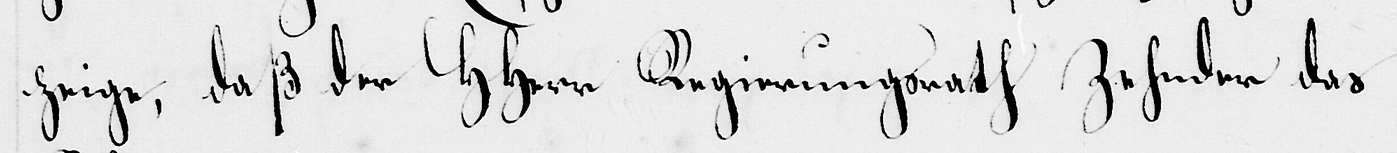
zeige, daß der HHerr Regierungsrath Zehnder das
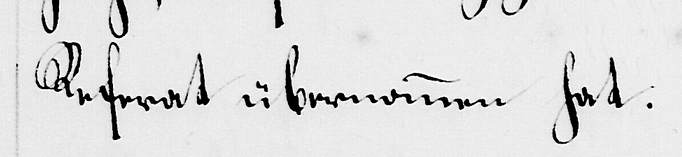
Referat übernommen hat.
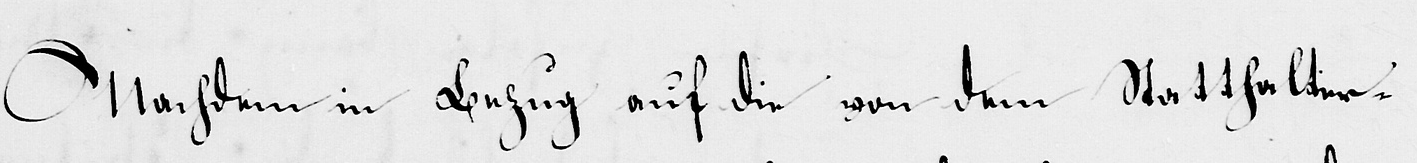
Nachdem in Bezug auf die von dem Statthalter¬
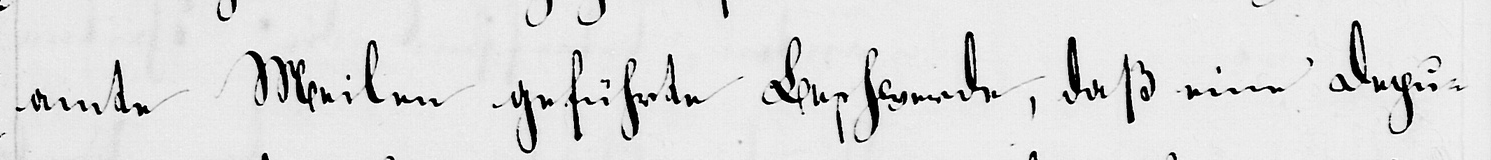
amte Meilen geführte Beschwerde, daß eine Depu¬
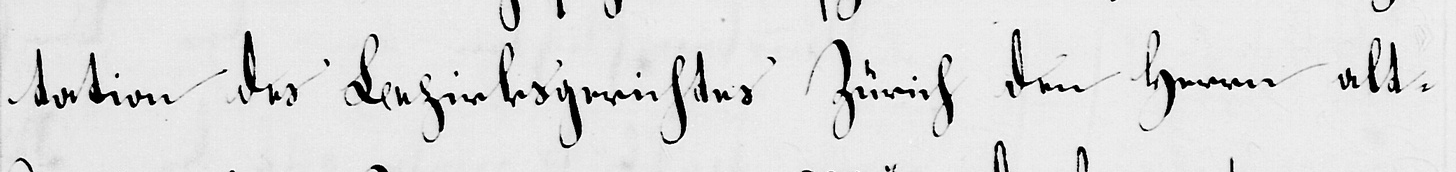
tation des Bezirksgerichtes Zürich den Herrn al¬
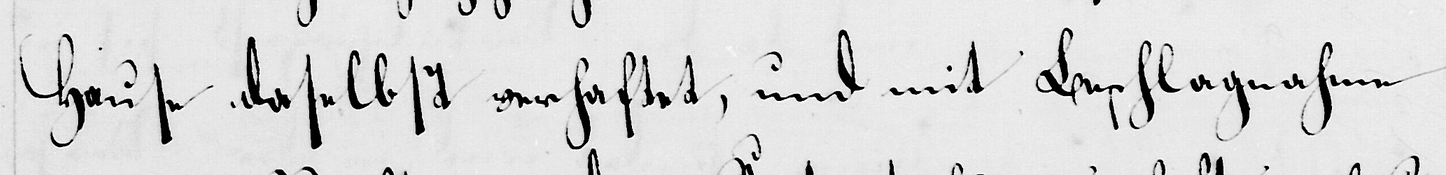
Hause daselbst verhaftet, und mit Beschlagnahme
